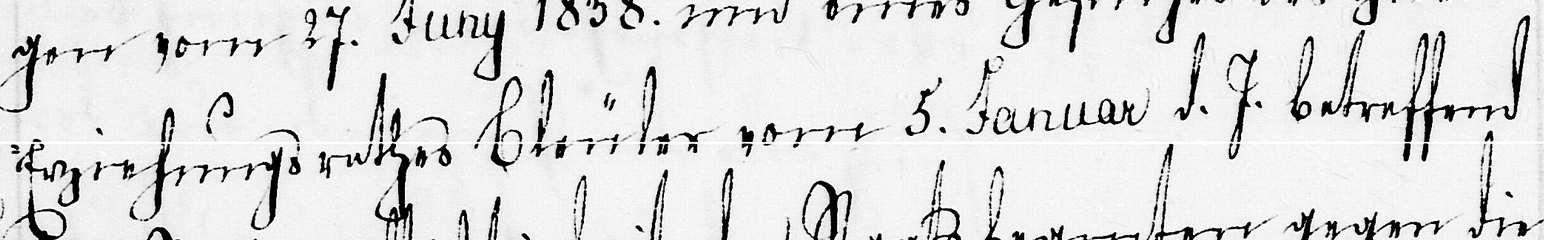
Erziehungsrathes Bleuler vom 5. Januar d. J. betreffend
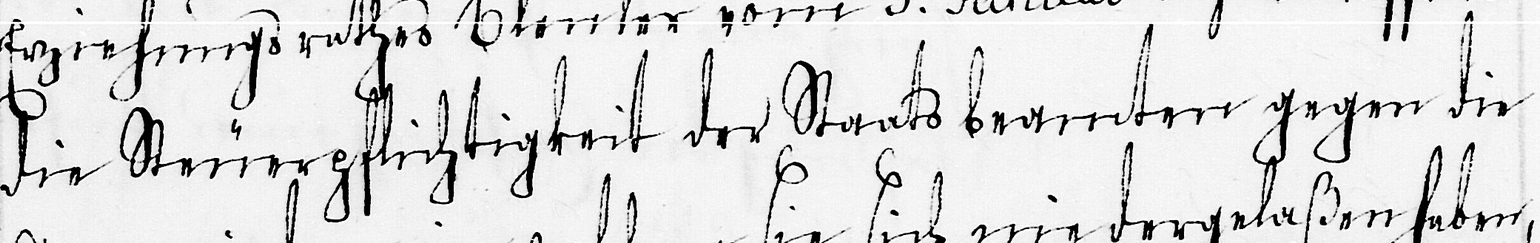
die Steuerpflichtigkeit der Staatsbeamten gegen die
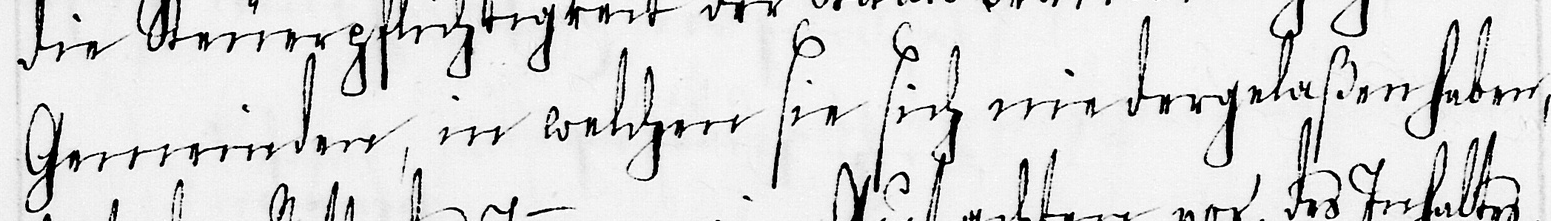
Gemeinden, in welchen sie sich niedergelaßen haben,
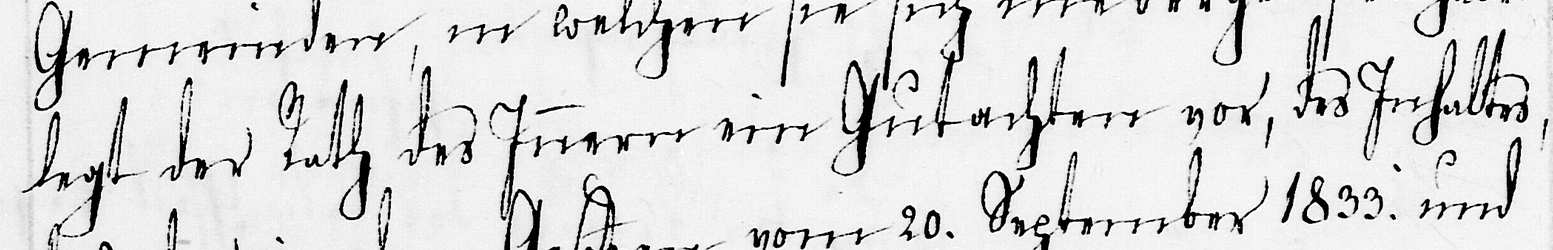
legt der Rath des Innern ein Gutachten vor, des Inhalte¬
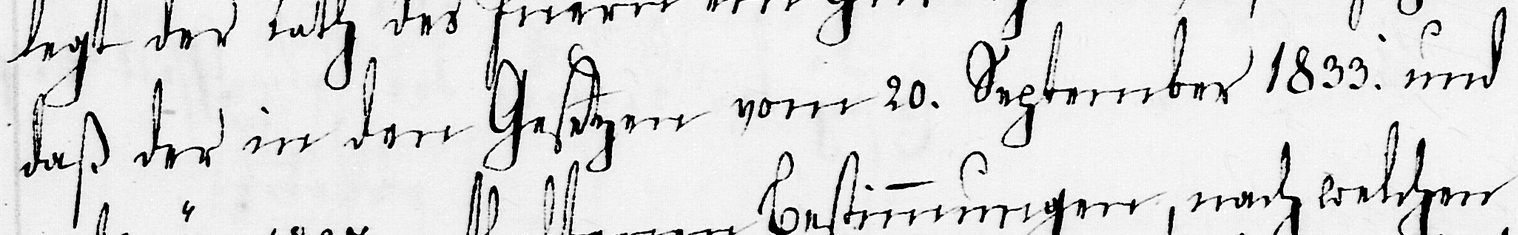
daß der in den Gesetzen vom 20. September 1833. und
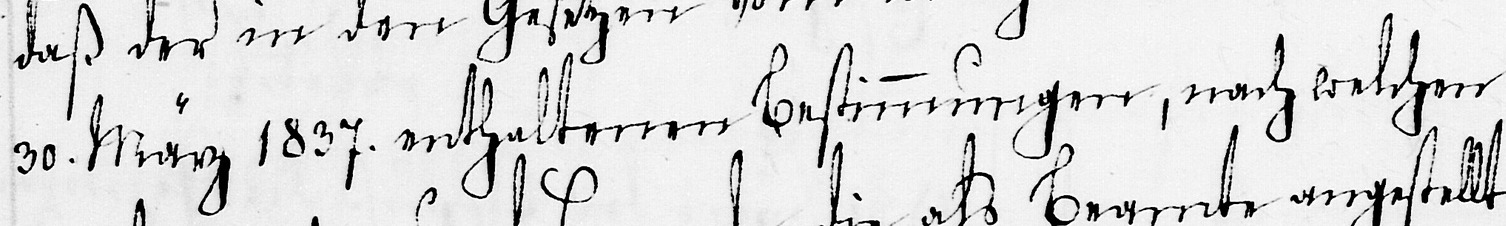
30. März 1837. enthaltenen Bestimmungen, nach welchen
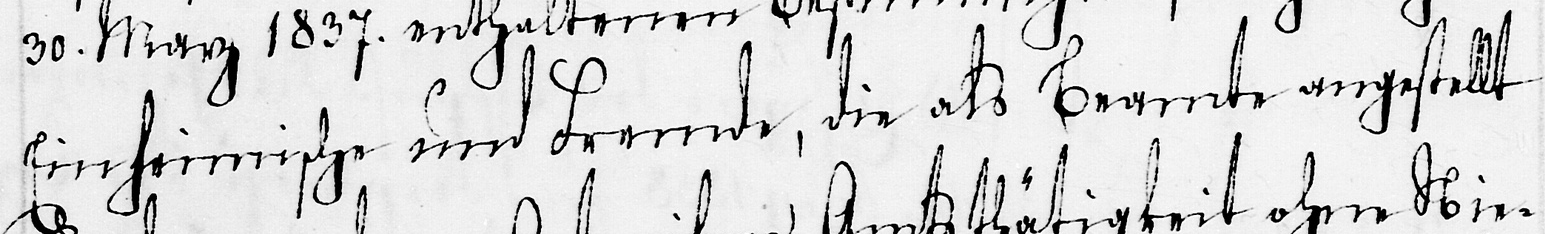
Einheimische und Fremde, die als Beamte angestellt
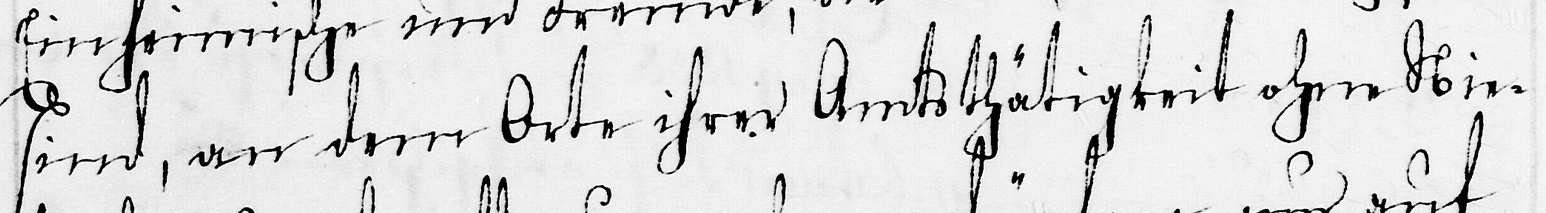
sind, an dem Orte ihrer Amtsthätigkeit ohne Nie¬
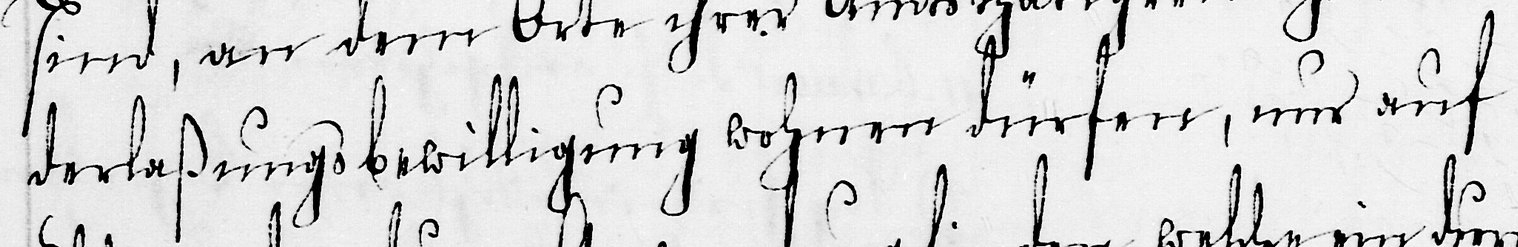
derlaßungsbewilligung wohnen dürfen, nur auf
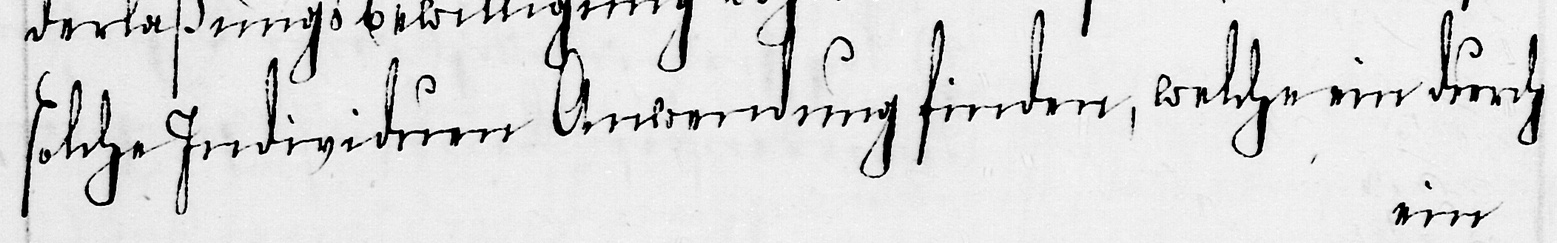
solche Individuen Anwendung finden, welche ein durch
